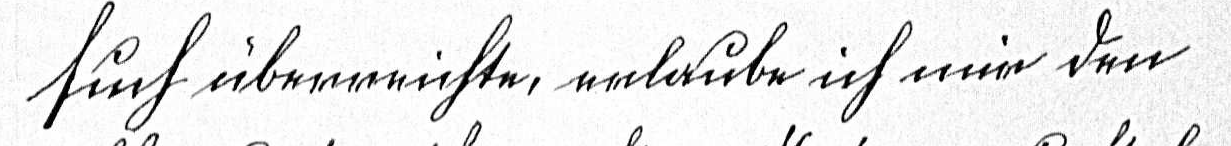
such überreichte , erlaube ich mir den
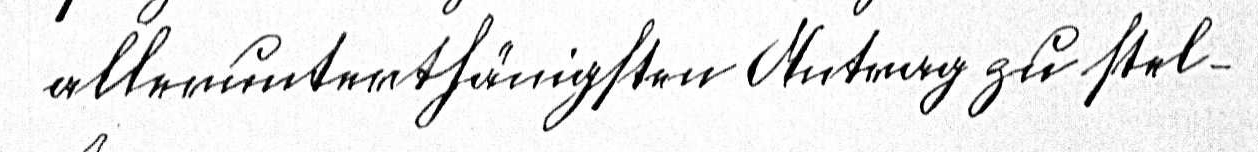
allerunterthänigsten Antrag zu stel¬
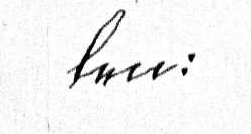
len:
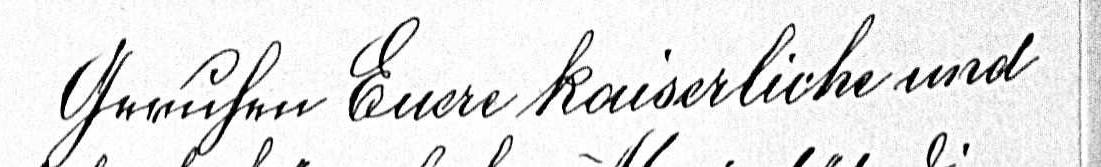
Geruhen Euere Kaiserliche und
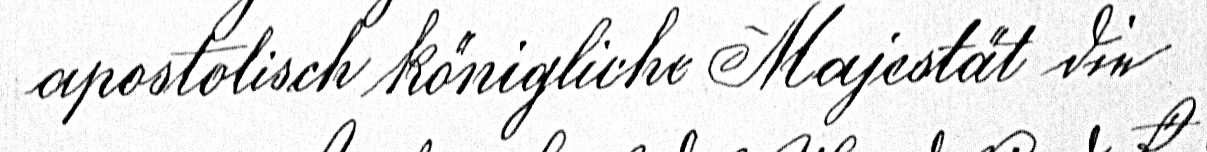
apostolisch königliche Majestät die
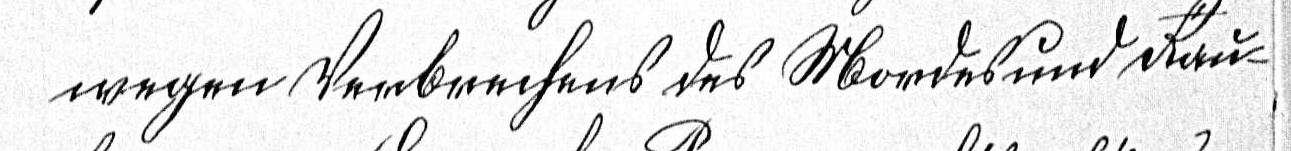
wegen Verbrechens des Mordes und Rau¬
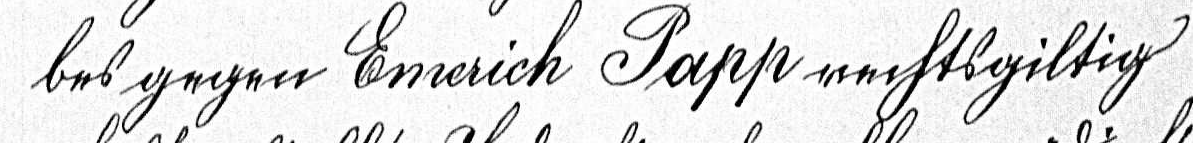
bes gegen Emerich Papp rechtsgiltig
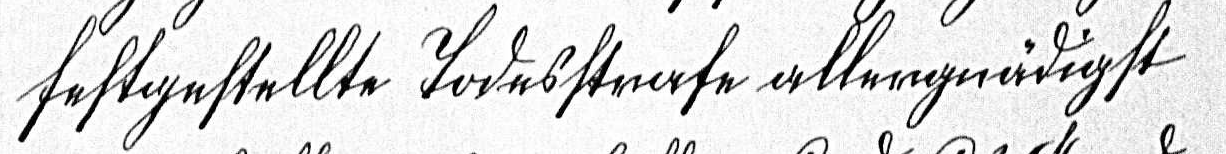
festgestellte Todesstrafe allergnädigst
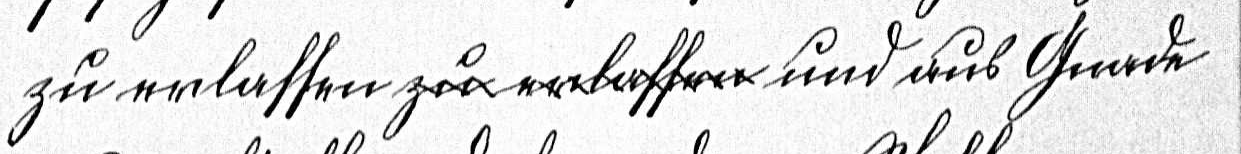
zu erlassen und aus Gnade
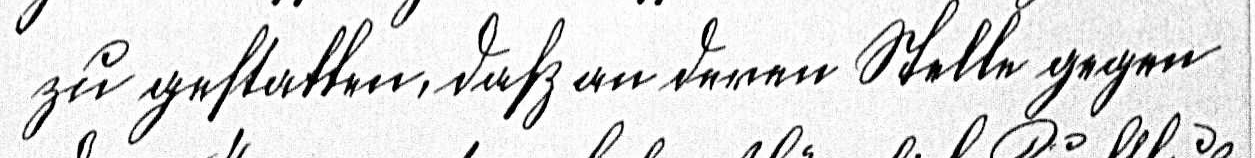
zu gestatten, daß an deren Stelle gegen
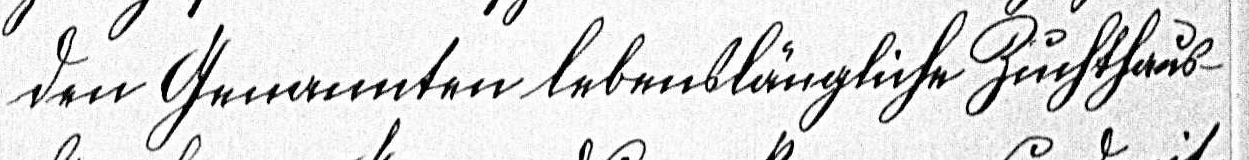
den Genannten lebenslängliche Zuchtshaus¬
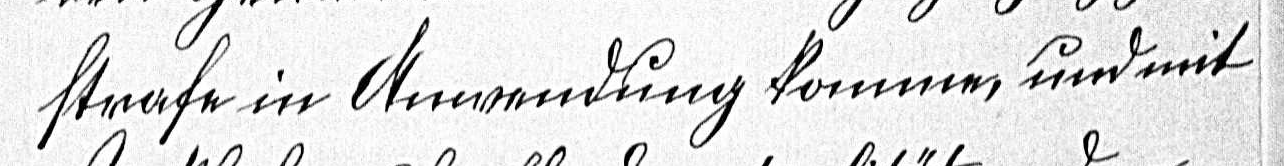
strafe in Anwendung komme, und mit
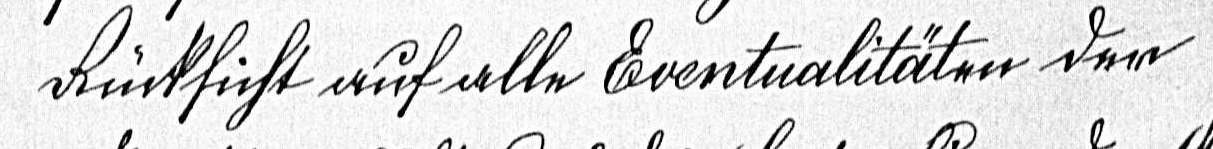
Rücksicht auf alle Eventualitäten der
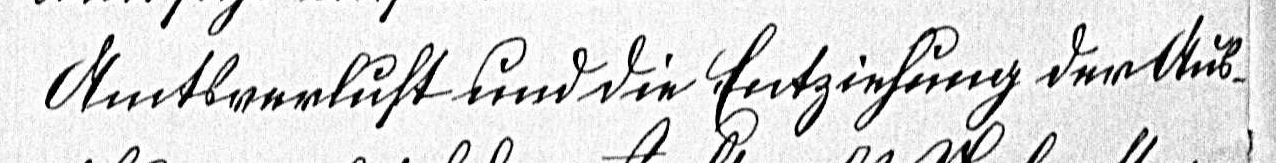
Amtsverlust und die Entziehung der Aus¬
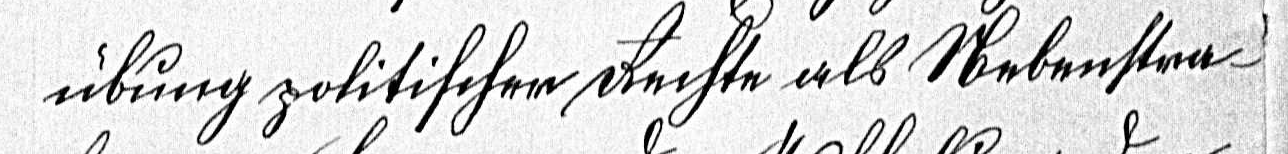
übung politischer Rechte als Nebenstra¬
